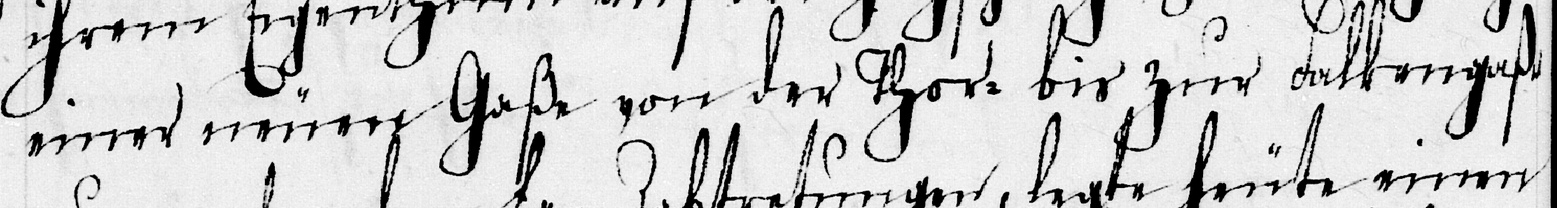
einer neuen Gaße von der Thor- bis zur Falkengaße
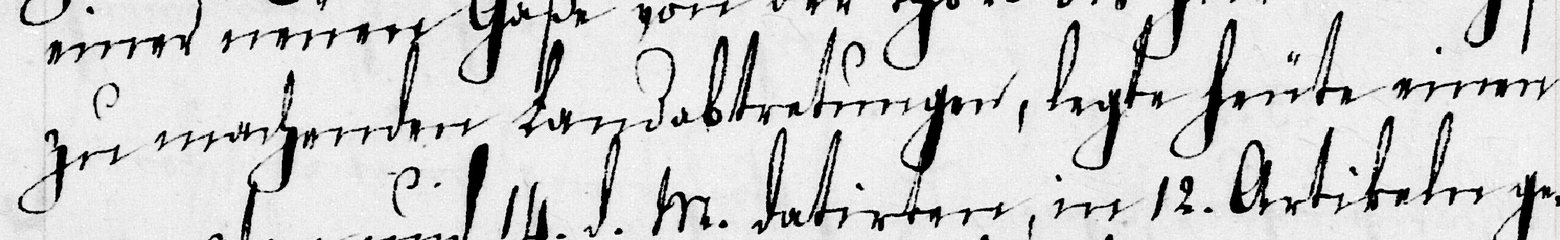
zu machenden Landabtretungen, legte heute einen
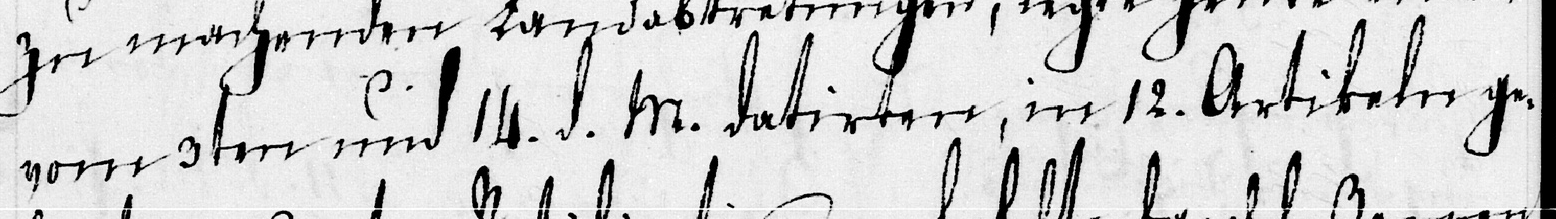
vom 3ten und 14. d. M. datirten, in 12. Artikeln ge¬
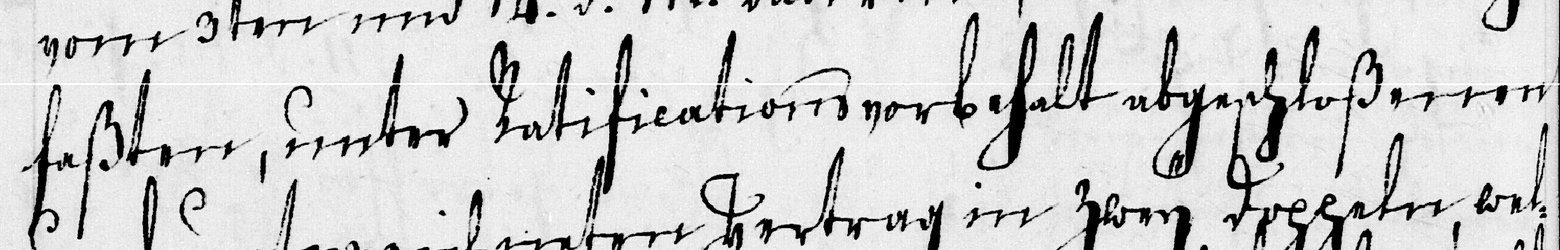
faßten, unter Ratificationsvorbehalt abgeschloßenen
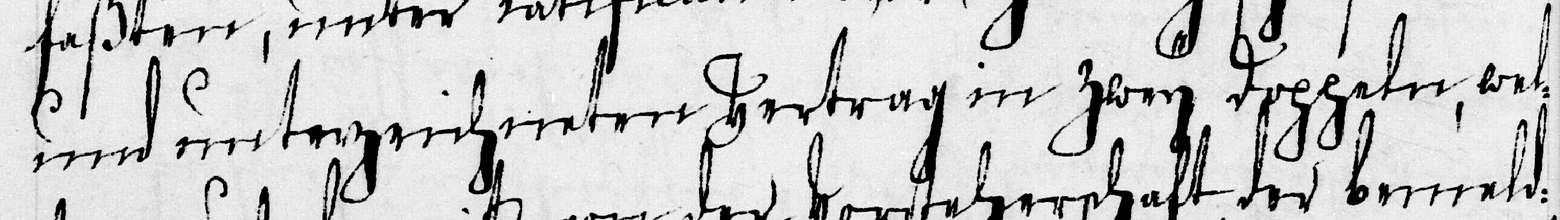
und unterzeichneten Vertrag in zwey Doppeln, wel¬
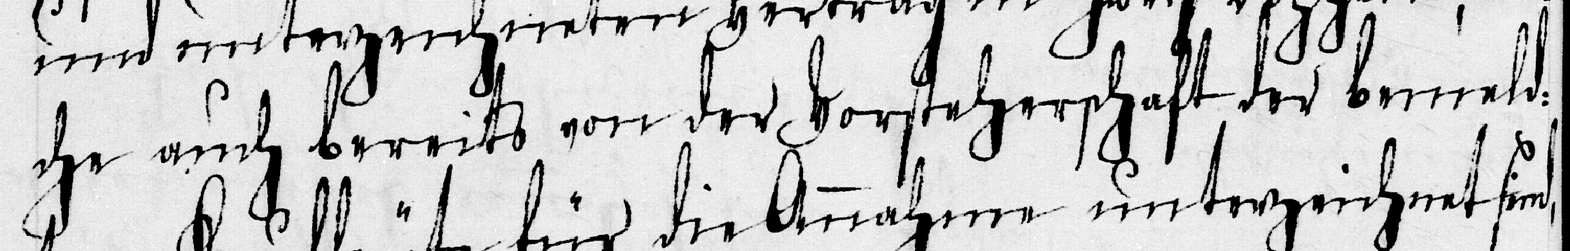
che auch bereits von der Vorsteherschaft der bemeld¬
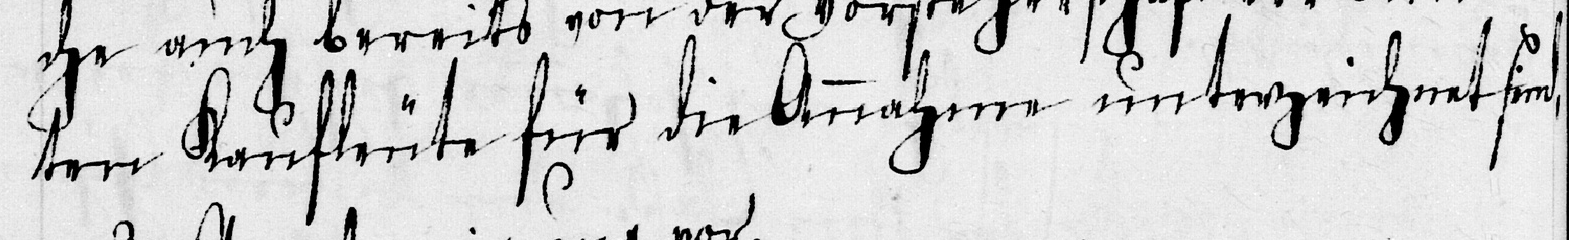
ten Kaufleute für die Annahme unterzeichnet si¬
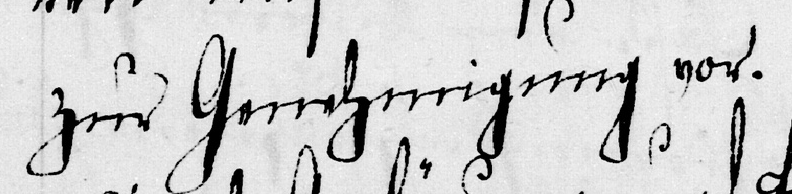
zur Genehmigung vor.
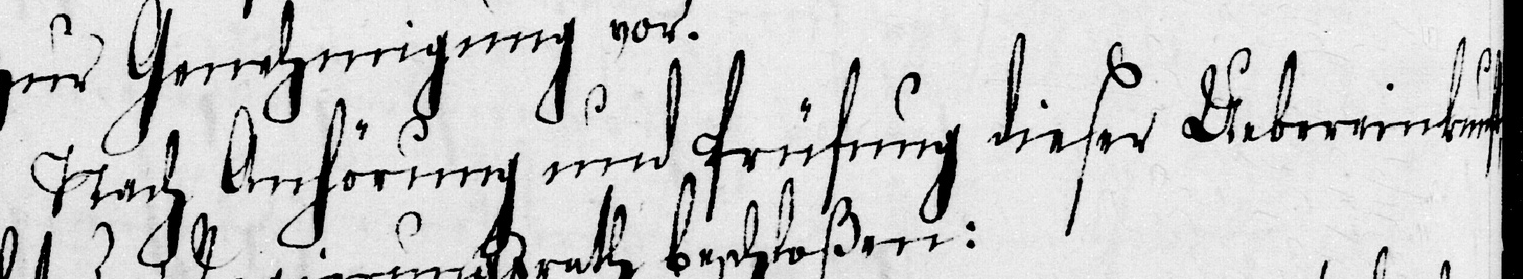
Nach Anhörung und Prüfung dieser Uebereinkun¬
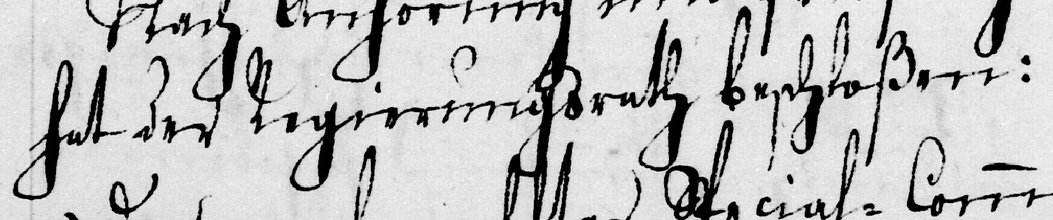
hat der Regierungsrath beschloßen:
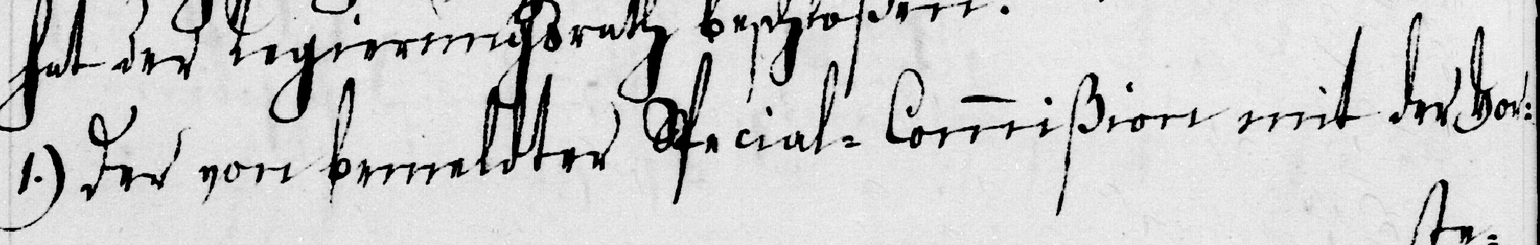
1.) Der von bemeldter Special-Commißion mit der Vo¬
